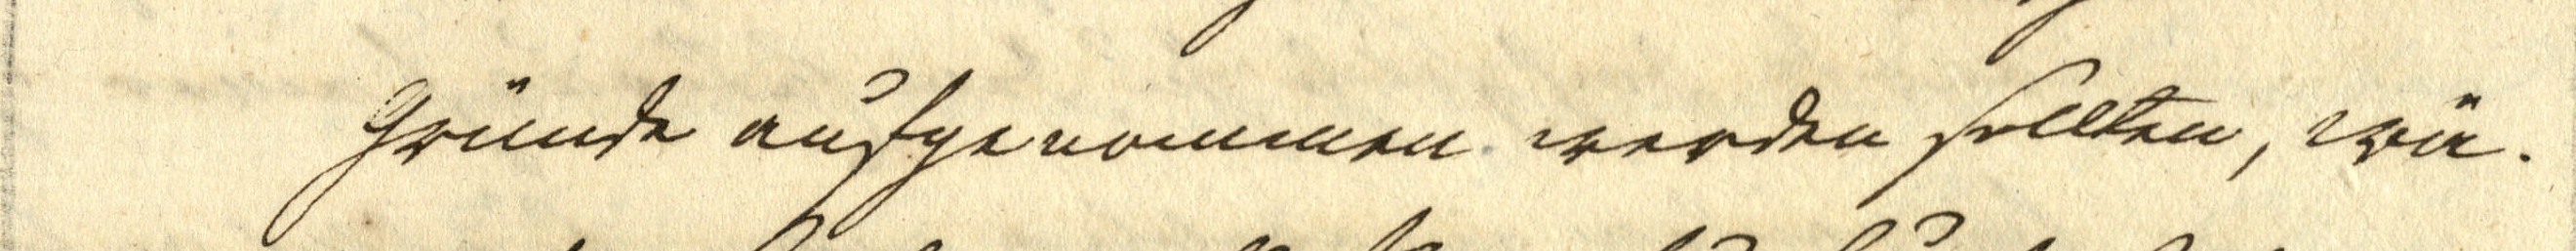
Gründe aufgenommen werden sollten, wä-
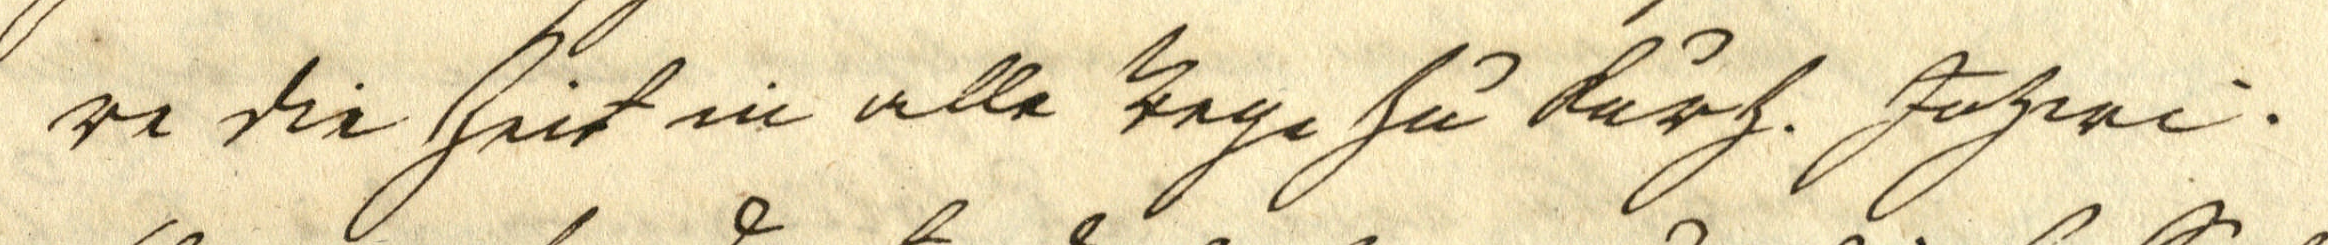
re die Zeit in alle Wege zu kurz. Inzwi-
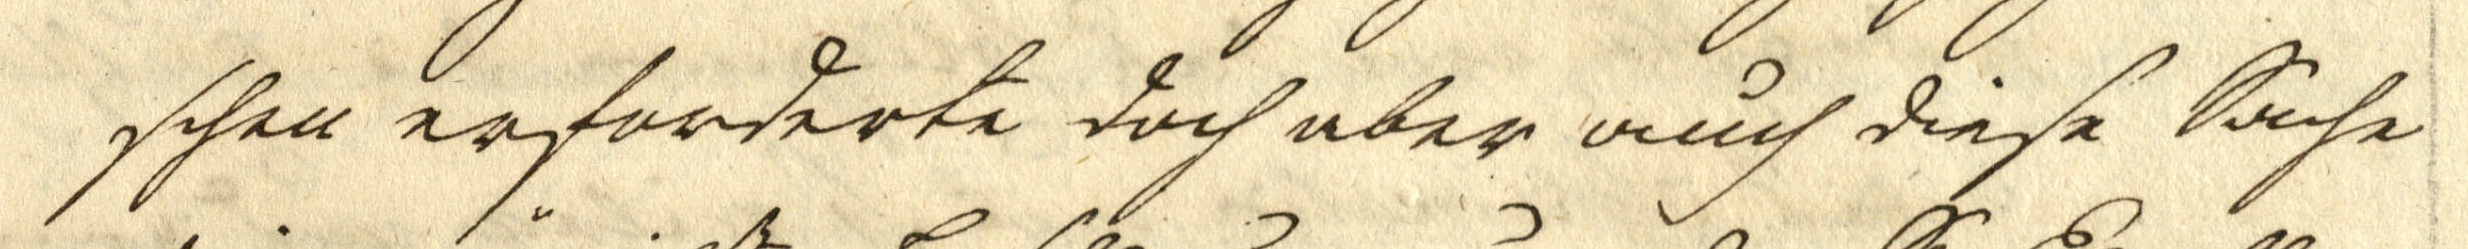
schen erforderte doch aber auch diese Sache
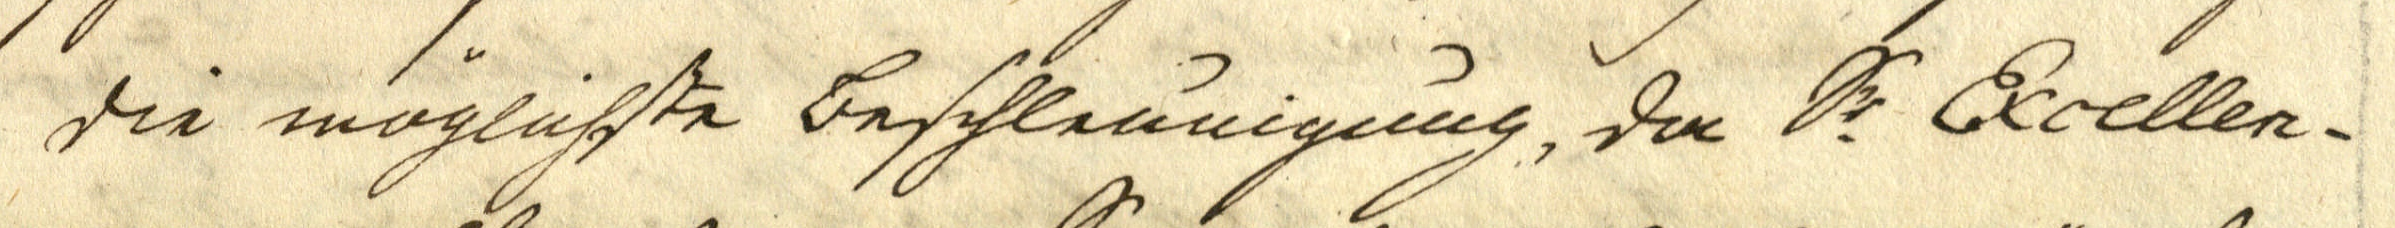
die möglichste Beschleunigung, da Sr. Excellen-
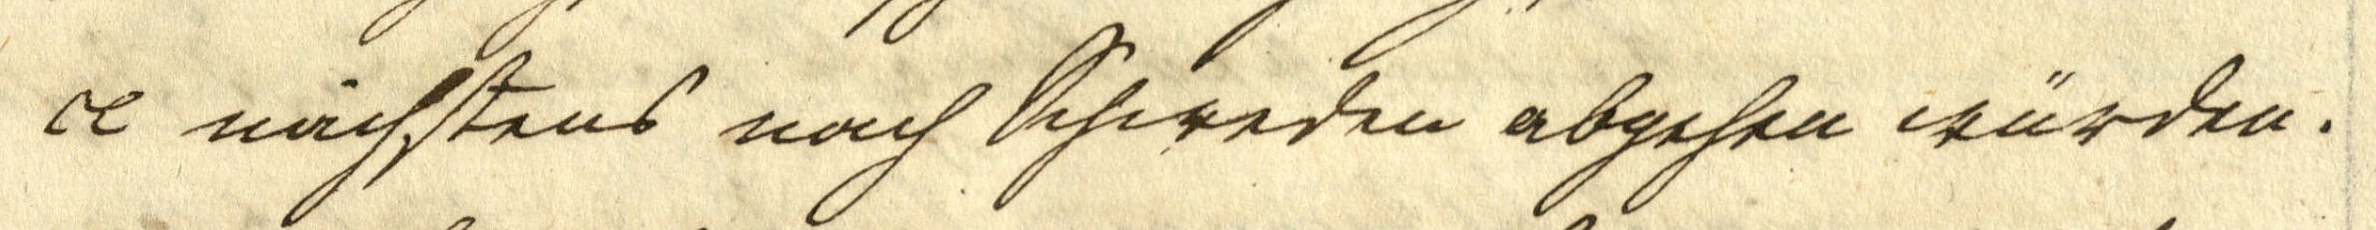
ce nächstens nach Schweden abgehen würden.
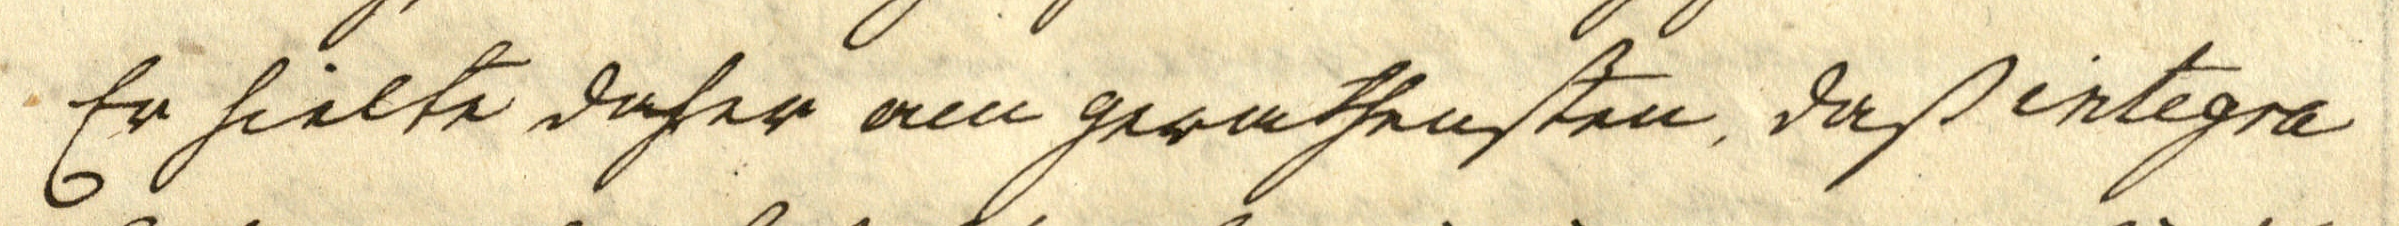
Er hielte daher am gerathensten, daß integra
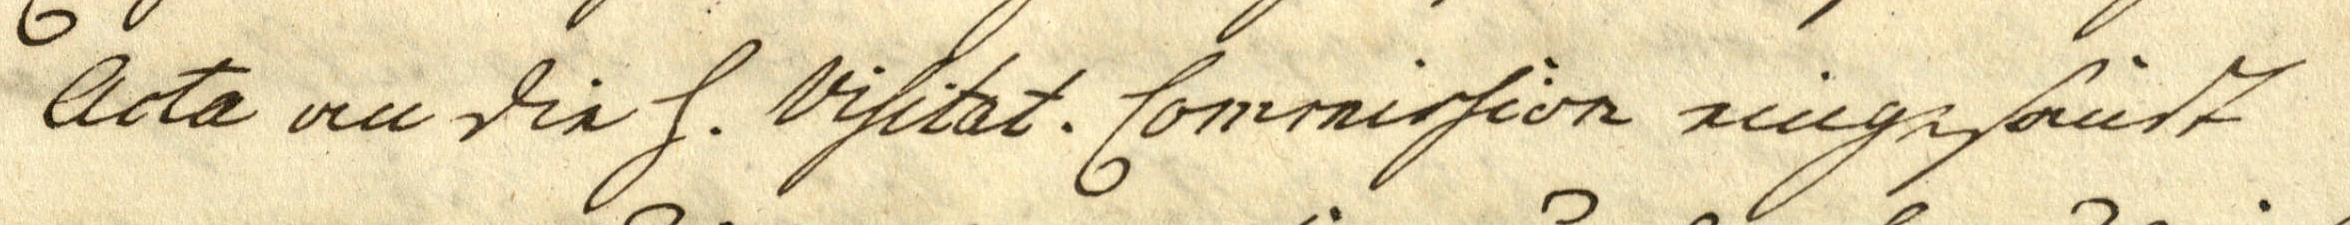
Acta an die h. Visitat. Commission eingesandt
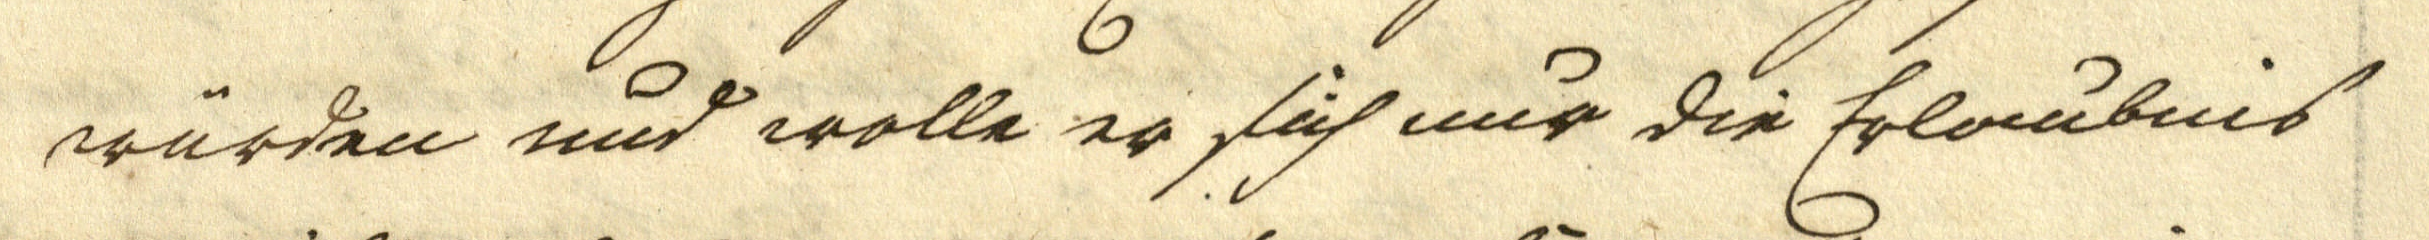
würden und wolle er sich nur die Erlaubnis
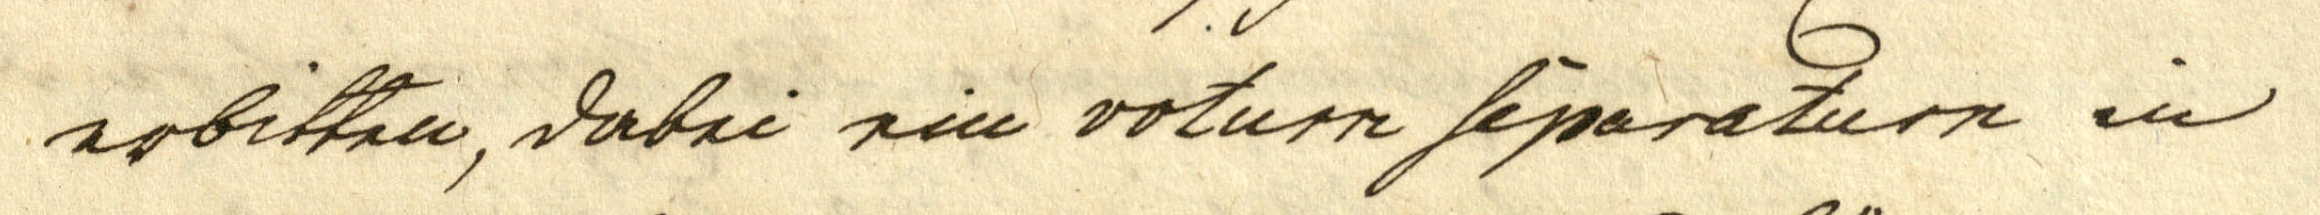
erbitten, dabei ein votum separatum in
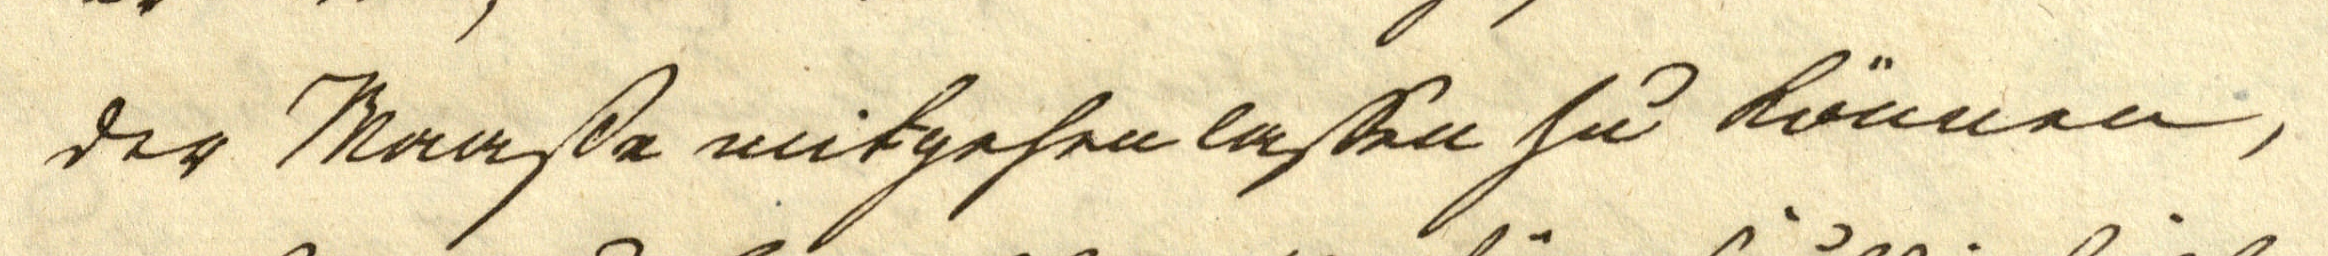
der Maaße mitgehen lassen zu können,
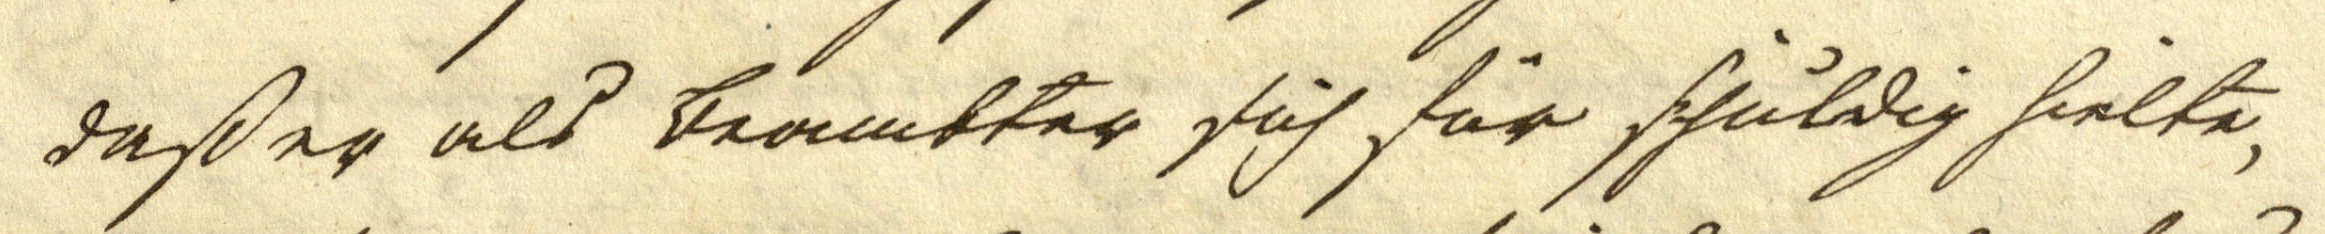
daß er als Beambter sich für schuldig hielte,
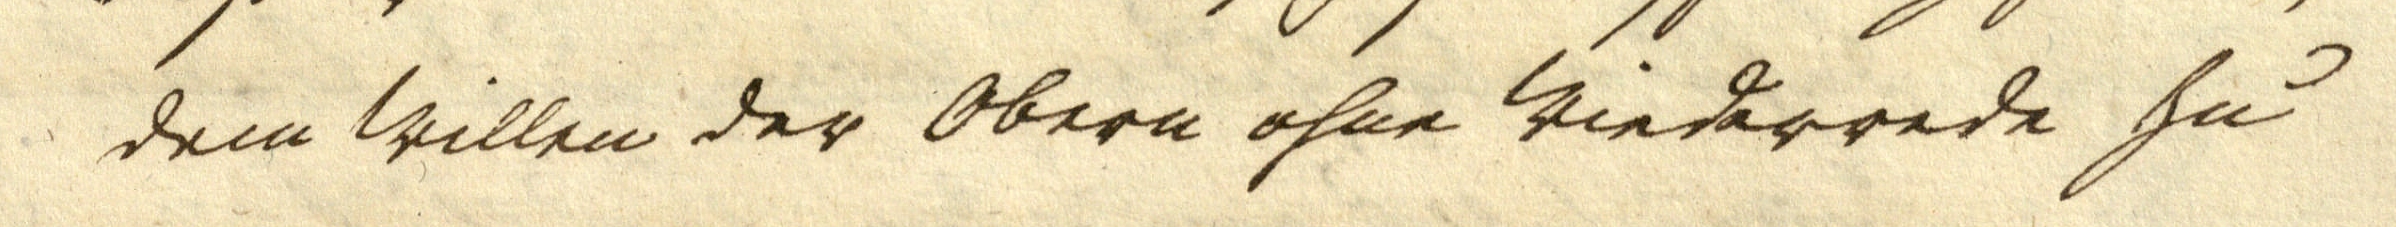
dem Willen der Obern ohne Wiederrede zu
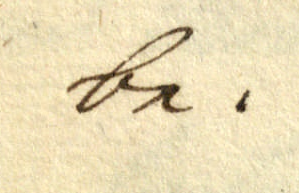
be-
